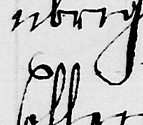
7.
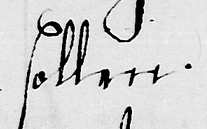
sollen.
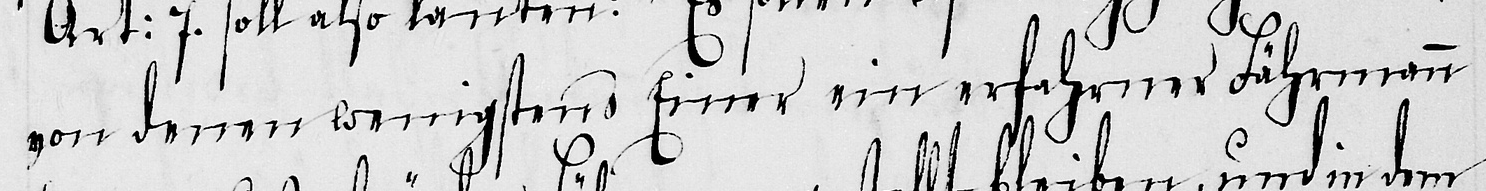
von denen wenigstens Einer ein erfahrener Fährmann
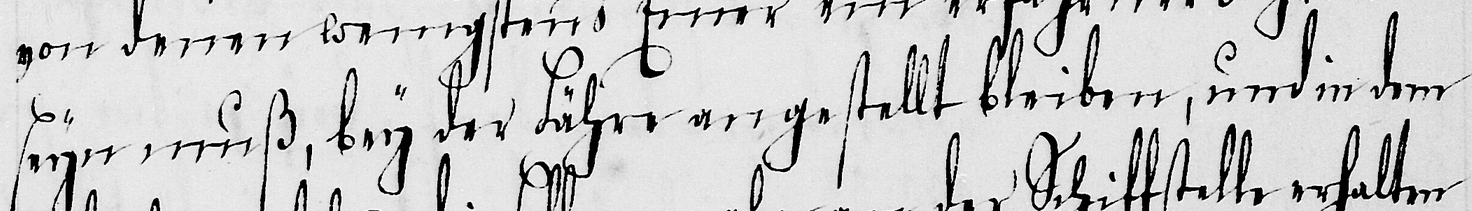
seyn muß, bey der Fähre angestellt bleiben, und in dem
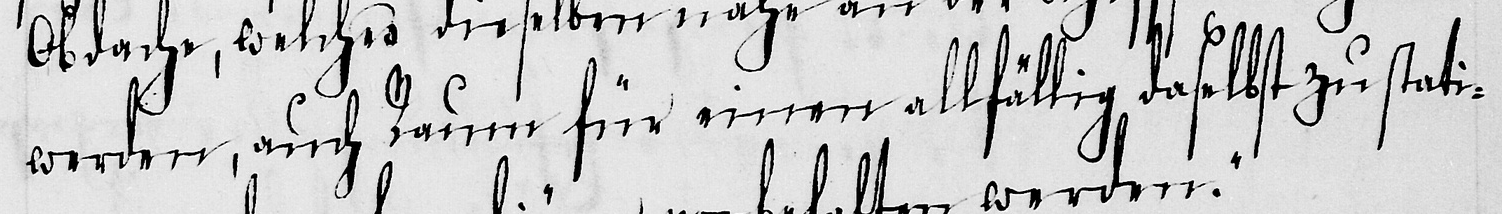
werden, auch Raum für einen allfällig daselbst zu sta¬
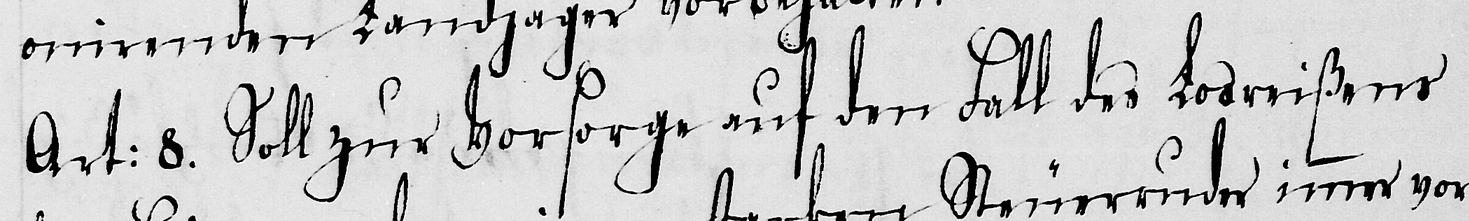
Art: 8. Soll zur Vorsorge auf den Fall des Losreißens
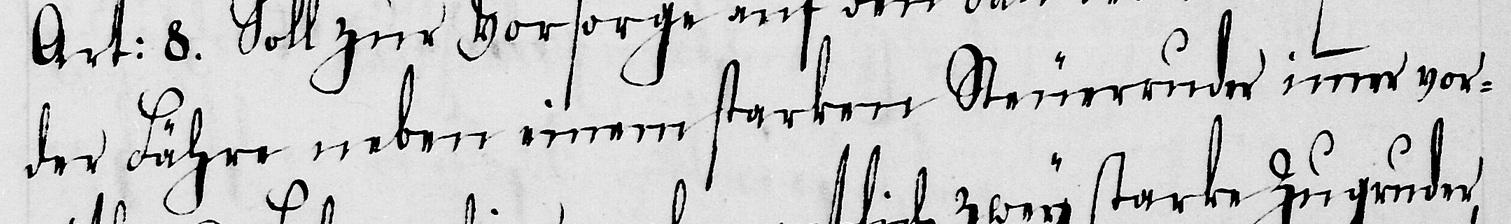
der Fähre neben einem starken Steuerruder immer vor¬
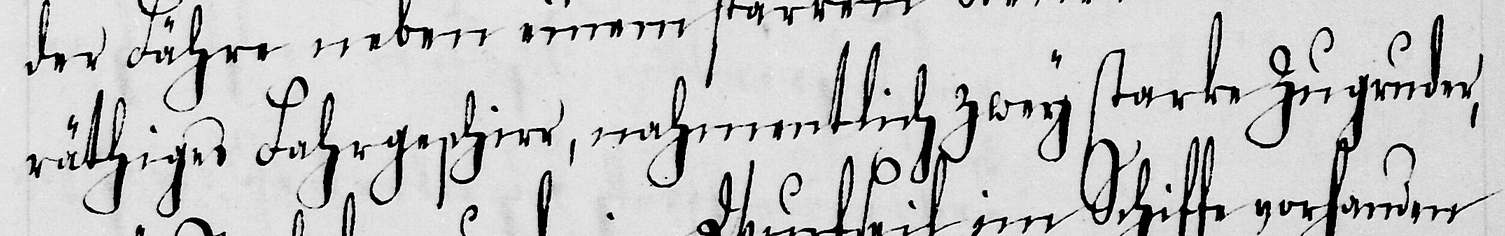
räthiges Fahrgeschirr, nahmentlich zwey starke Zugruder,
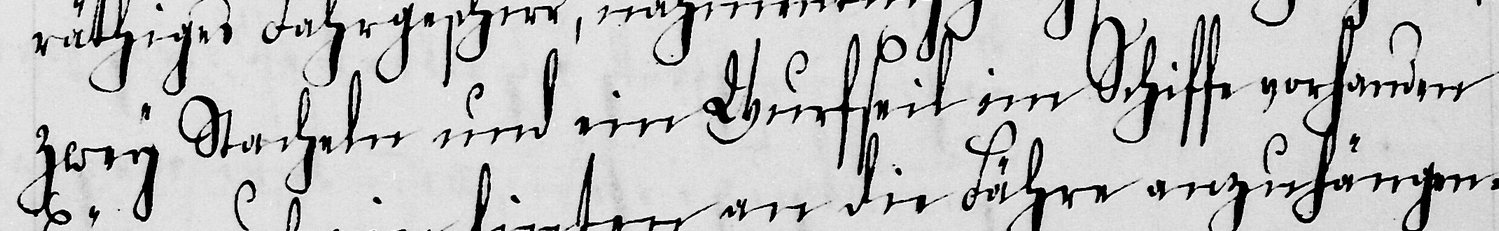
zwey Stacheln und ein Wurfseil im Schiffe vorhanden
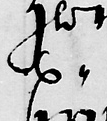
Art:
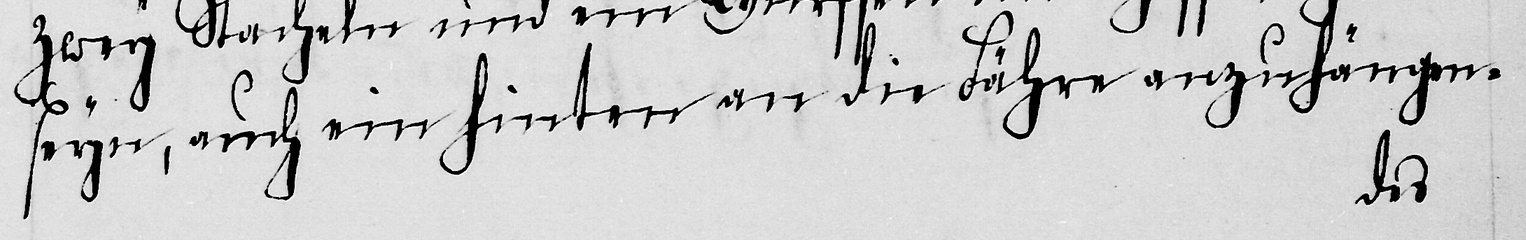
seyn, auch ein hinten an die Fähre anzuhängen-
